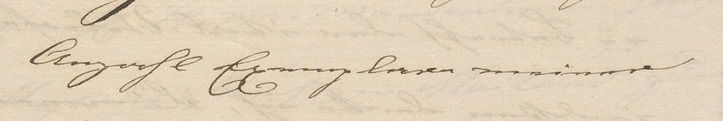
Anzahl Exemplare meiner
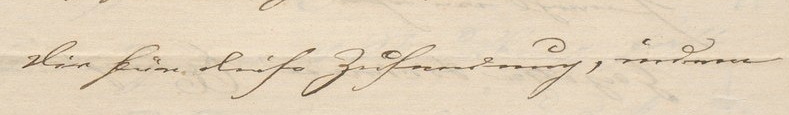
Dir für diese Zusendung, indem
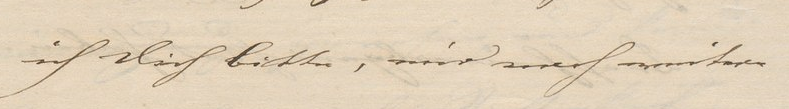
ich Dich bitte, mir noch weitere
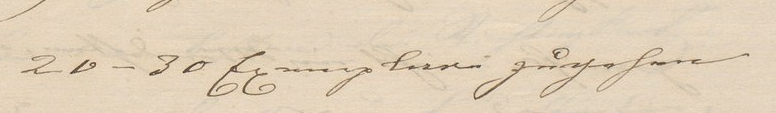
20–30 Exemplare zugehen
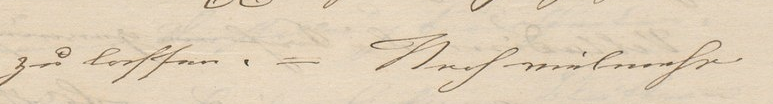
zu lassen. – Noch vielmehr
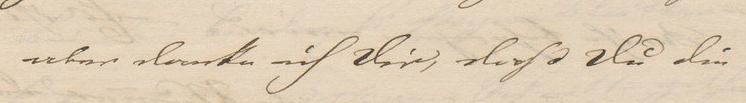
aber danke ich Dir, dass Du die
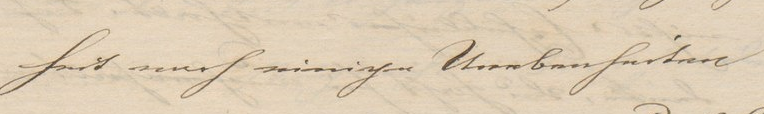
heit noch einige Unebenheiten
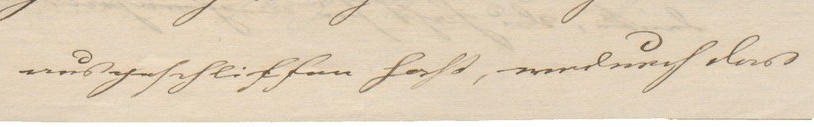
ausgeschliffen hast, wodurch das
